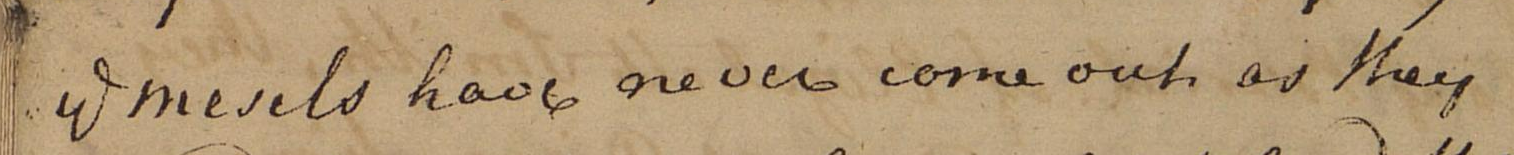y^e mesels have never come out as they
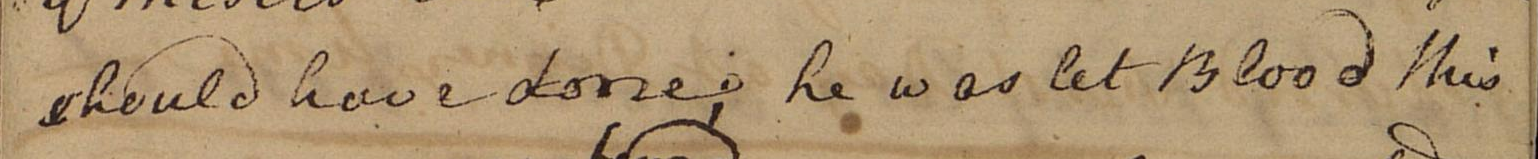should have done; he was let Blood this
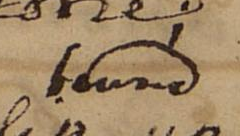bound
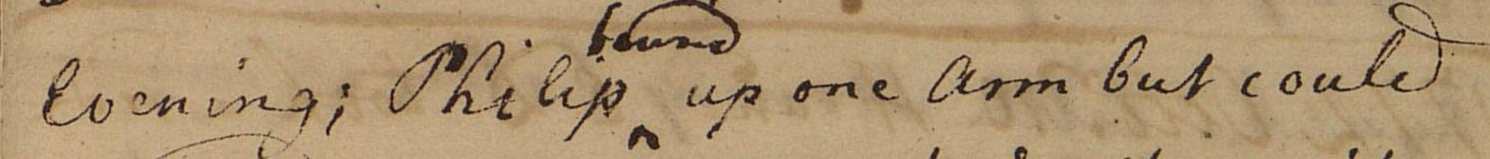Evening; Philip ^ up one Arm but could
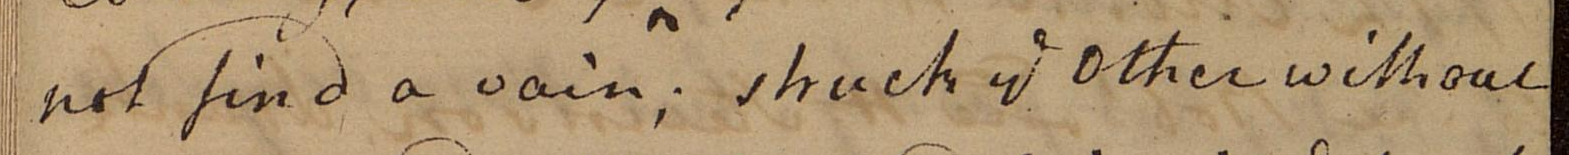not find a vain; struck y^e other without
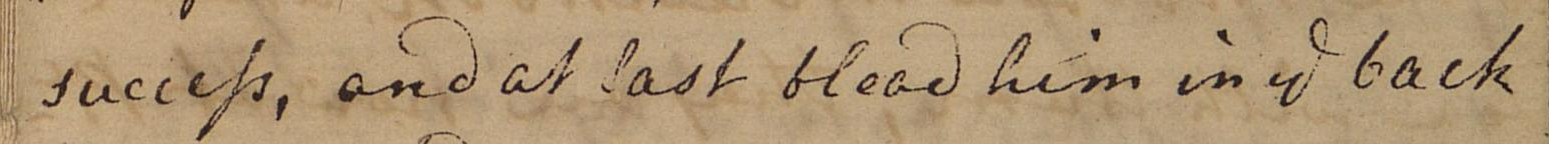success, and at last blead him in y^e back
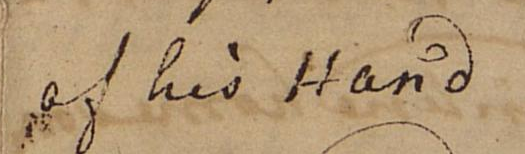of his Hand
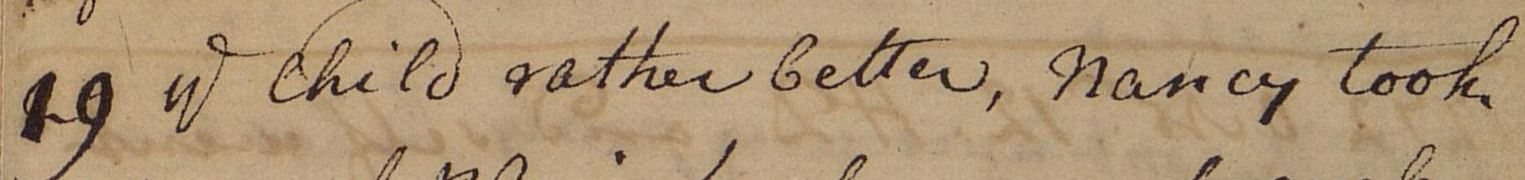19 y^e Child rather better, Nancy took
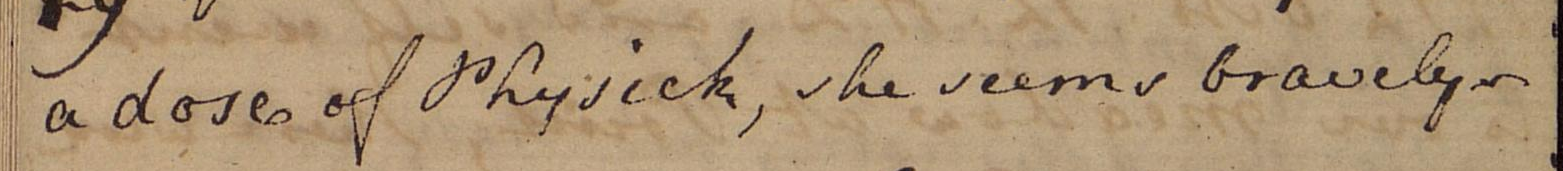a dose of Physick, she seems bravely-
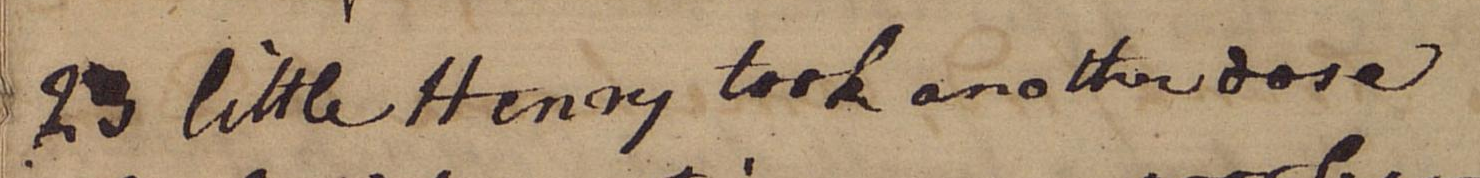23 little Henry took another dose
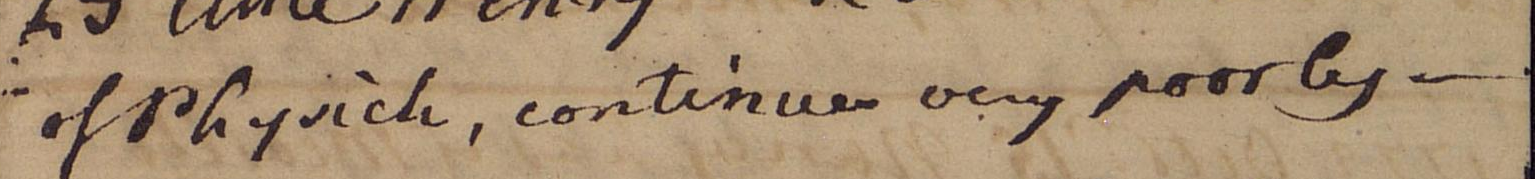of Physich, continue very poorly-
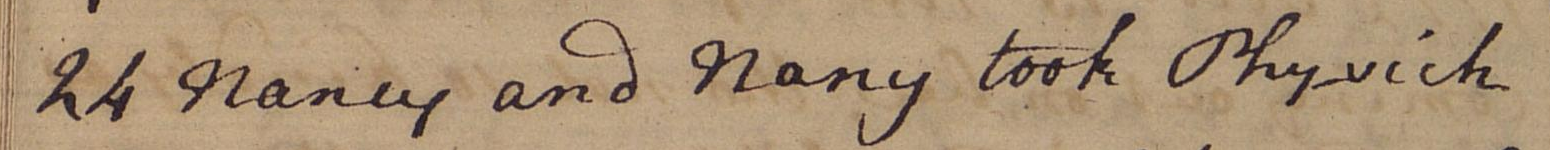24 Nancy and Nany took Physich
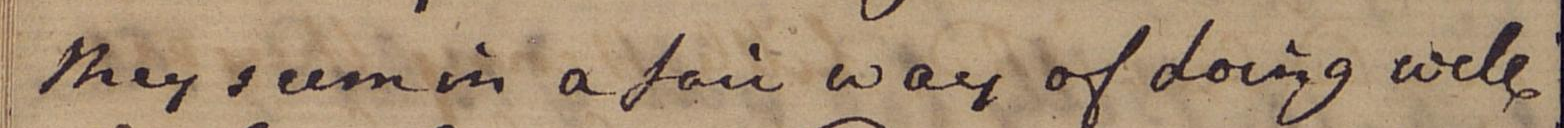they seem in a fair ways of doing well
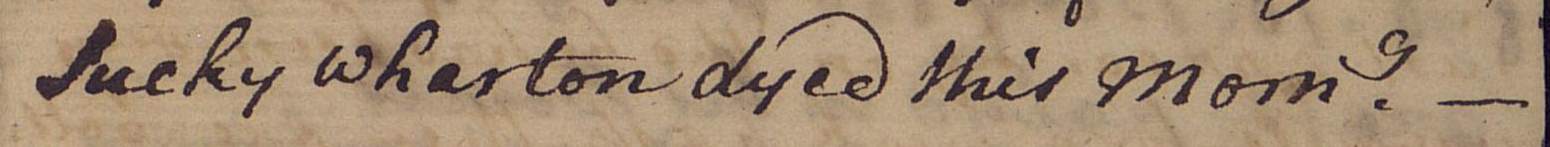Sucky Wharton dyed this Morn^g.-
